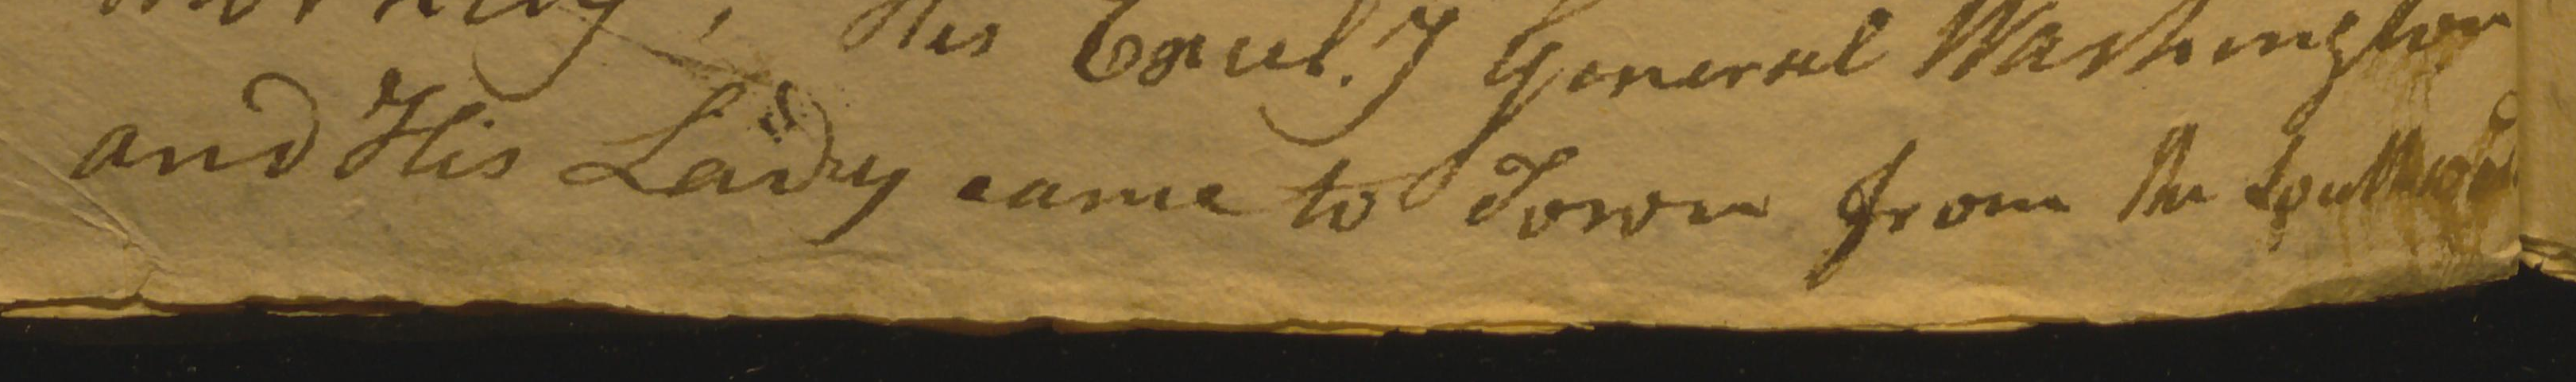and His Lady came to Town from the southward
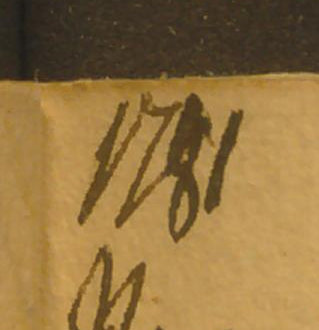1781
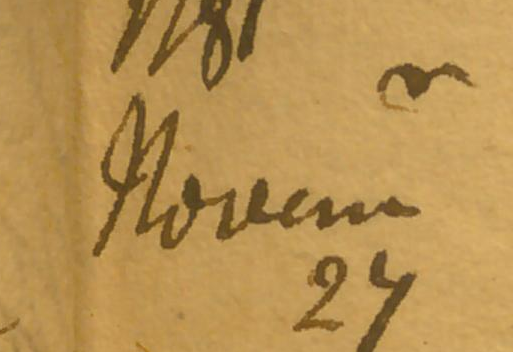Novem^r
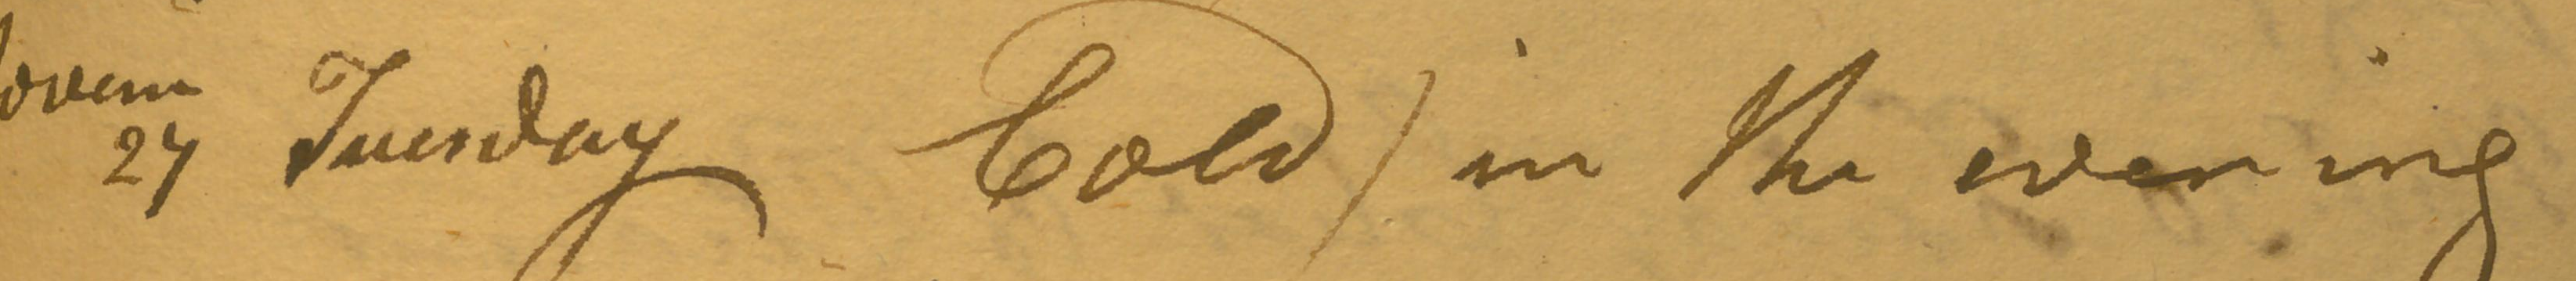27 Tuesday Cold / in the evening
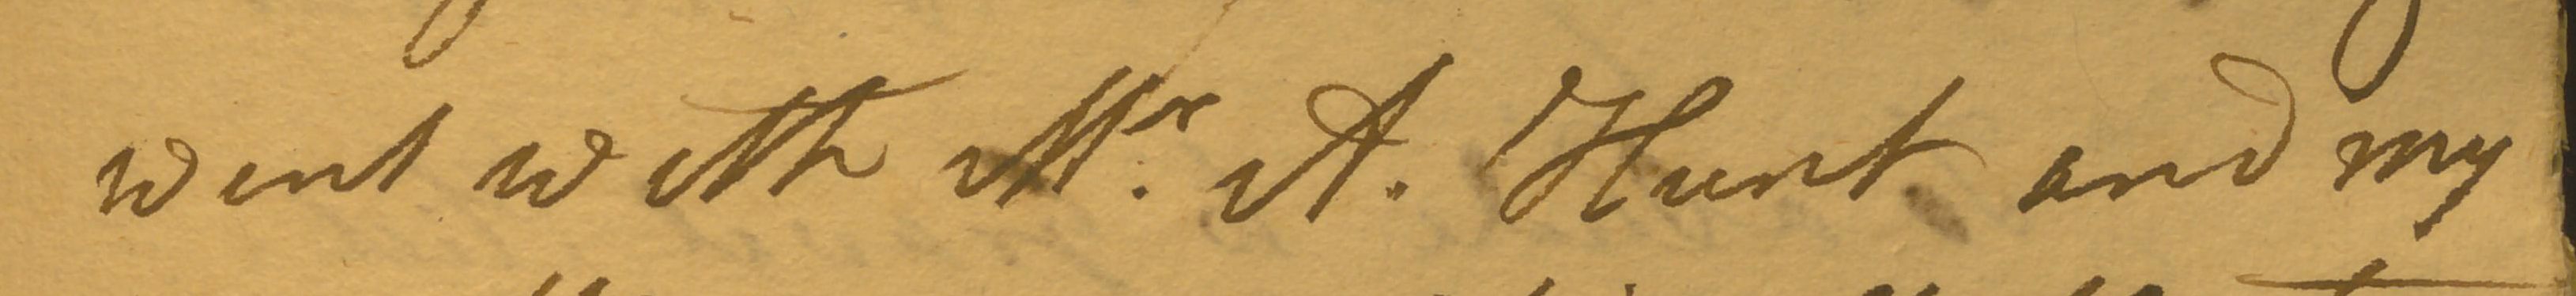went with M^r. A. Hunt and my
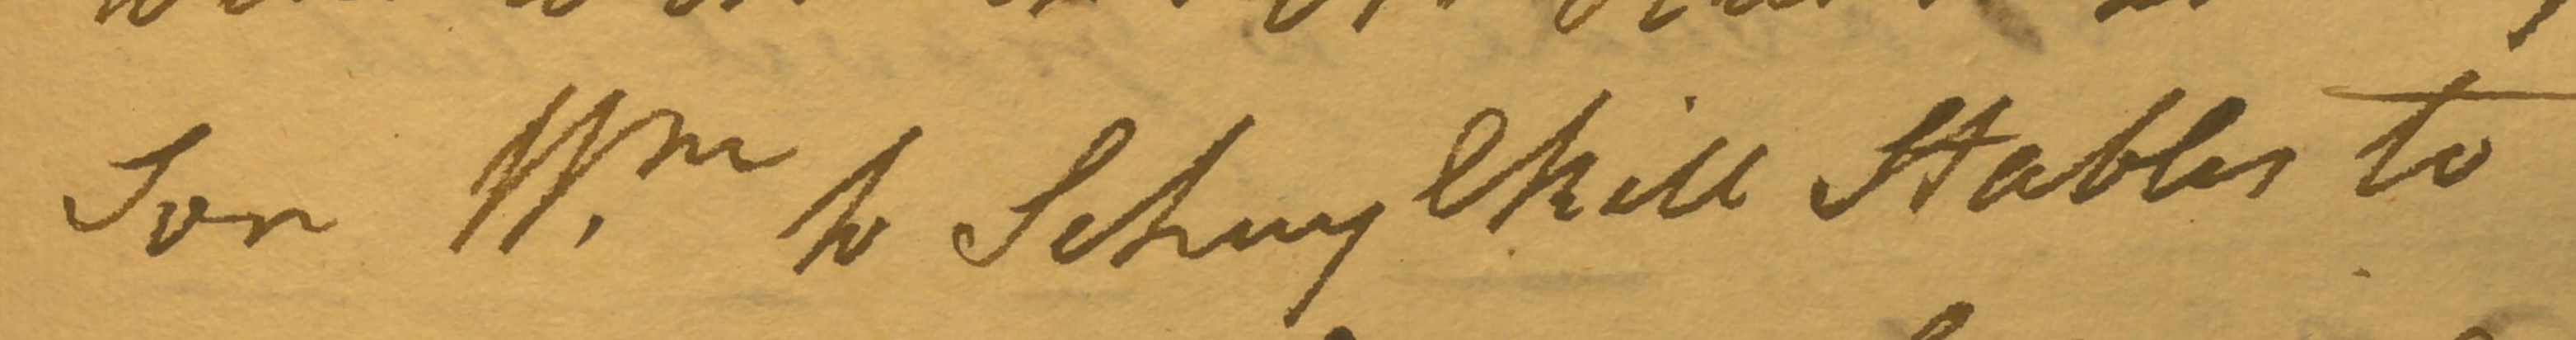Ton W^m. to Schuylkill Stables to
